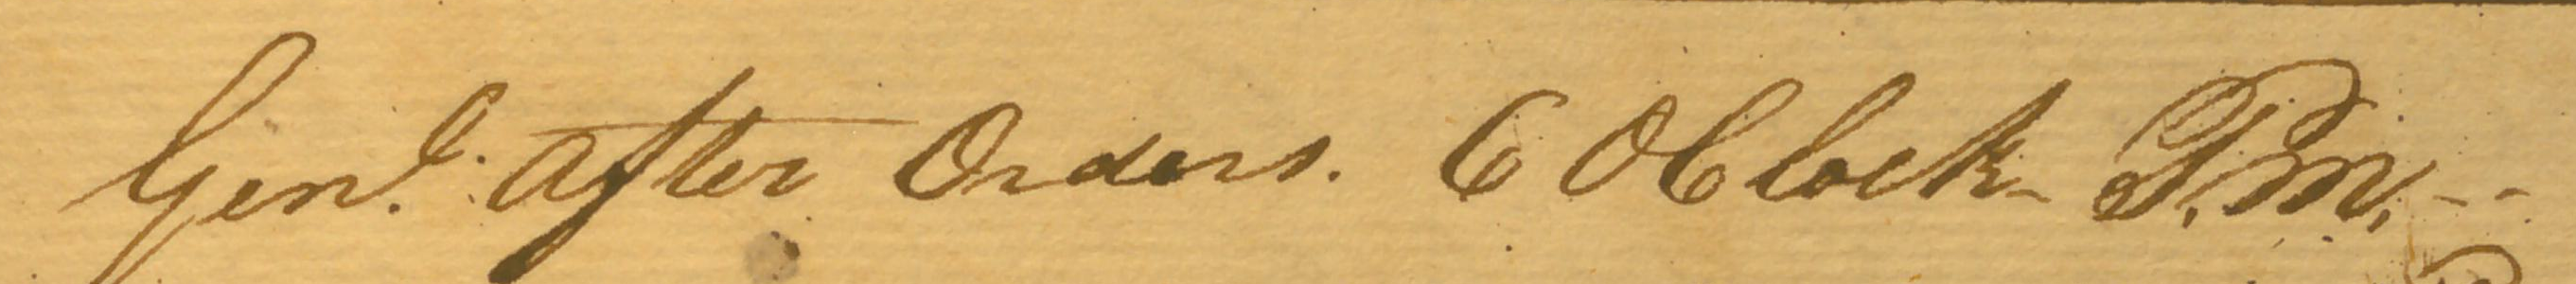Gen^l. After Orders. 6 Oclock P. M.
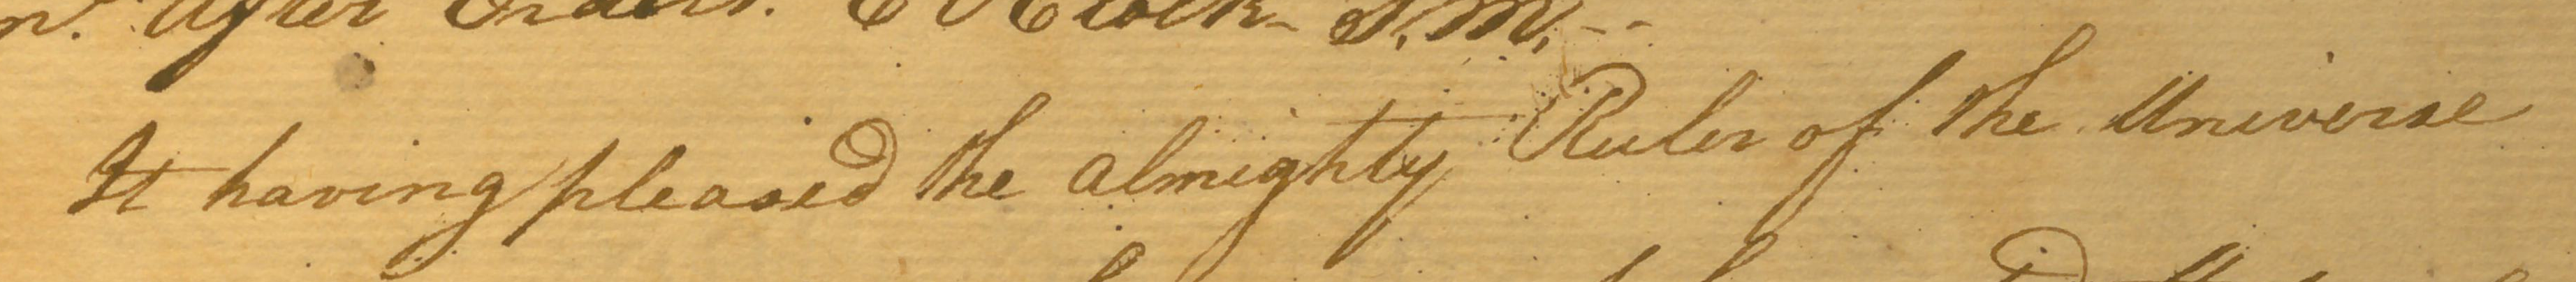It having pleased the almighty Ruler of the Universe
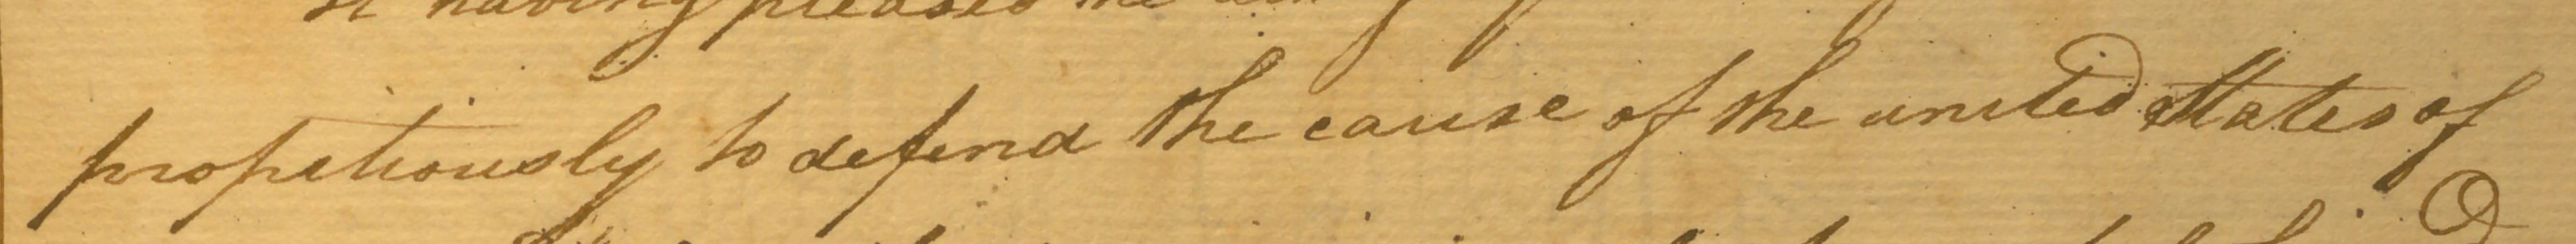propitiously to defend the cause of the united States of
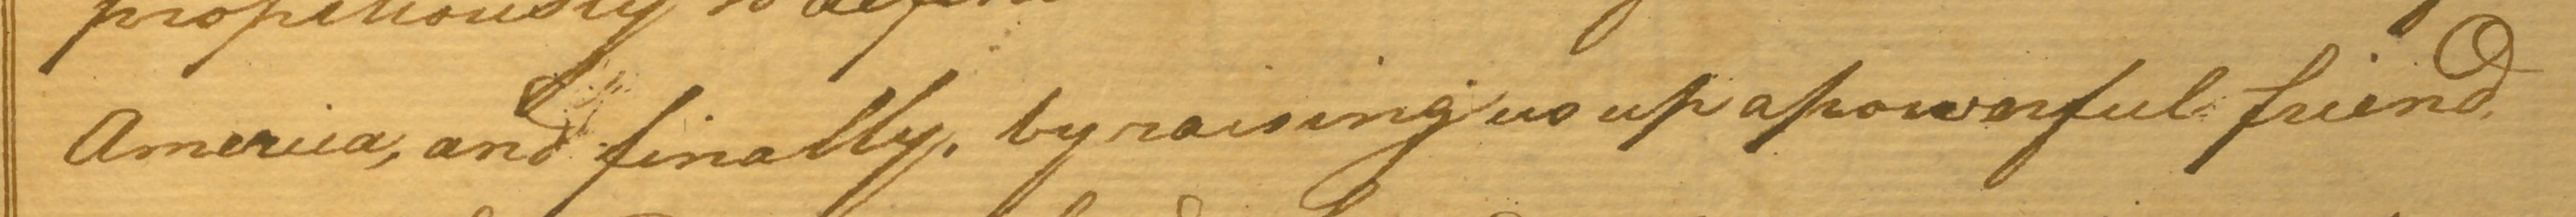America and finally by raising us up a powerful friend
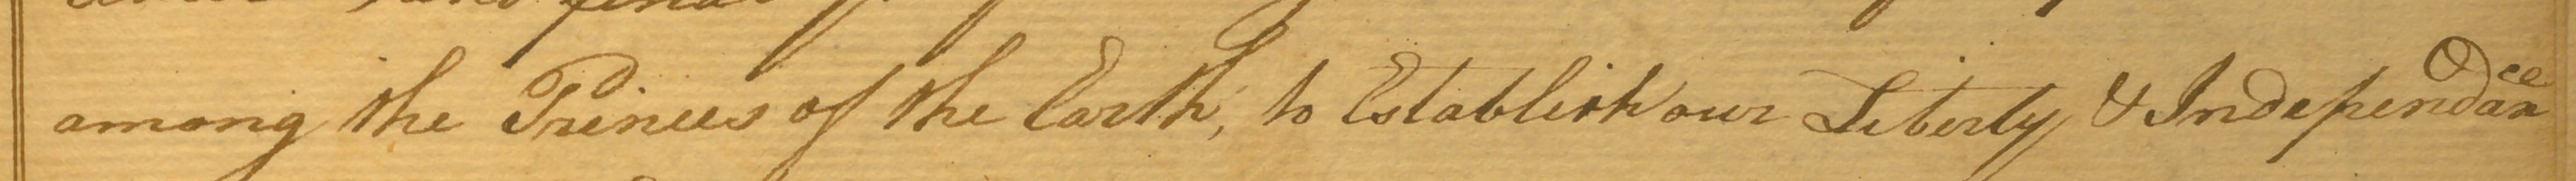among the Princes of the Earth, to Establish our Liberty & Independan^ce
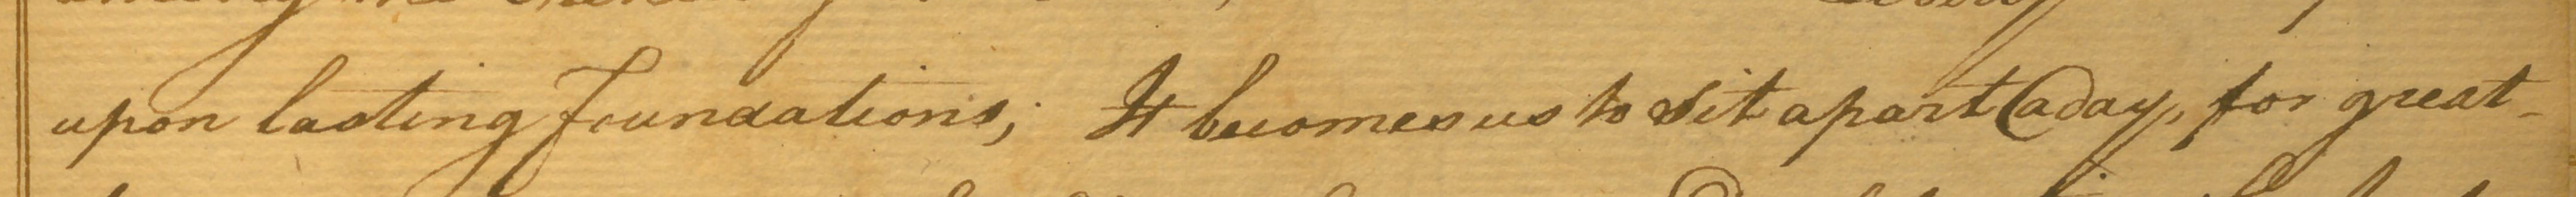upon lasting foundations; It becomes us to Sit apart a day for great-
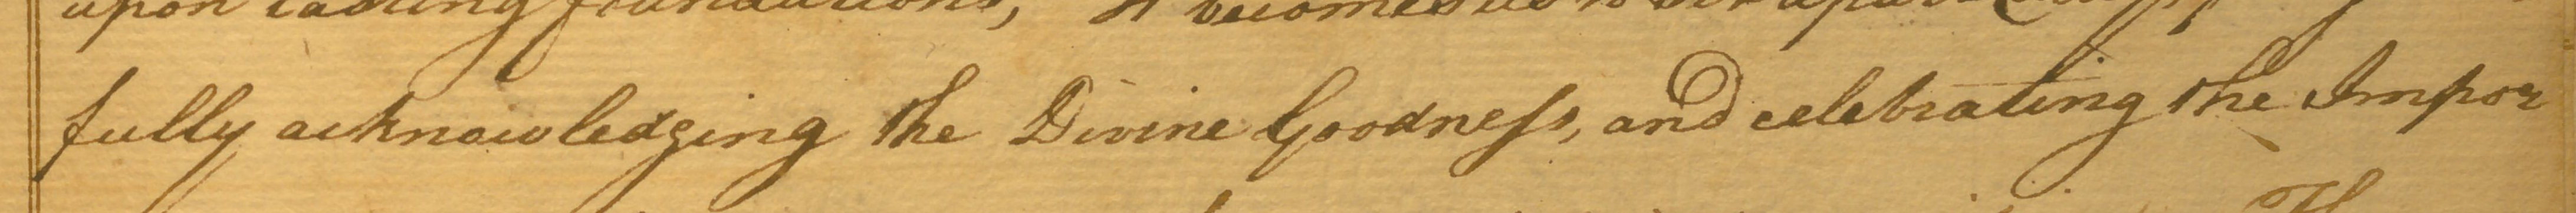fully acknowledging the Divine Goodness, and celebrating the Impor
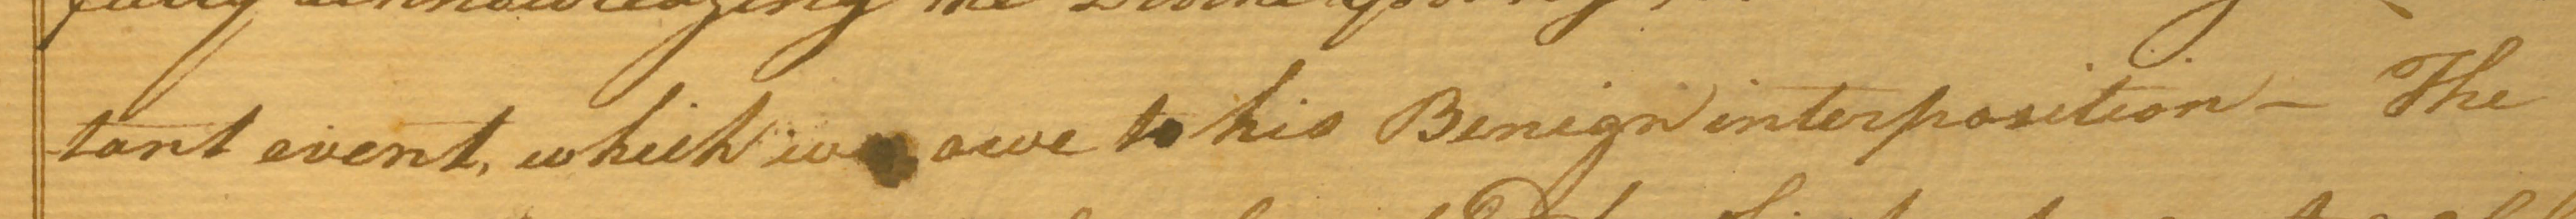tant event which we owe to his Benign interposition- The
